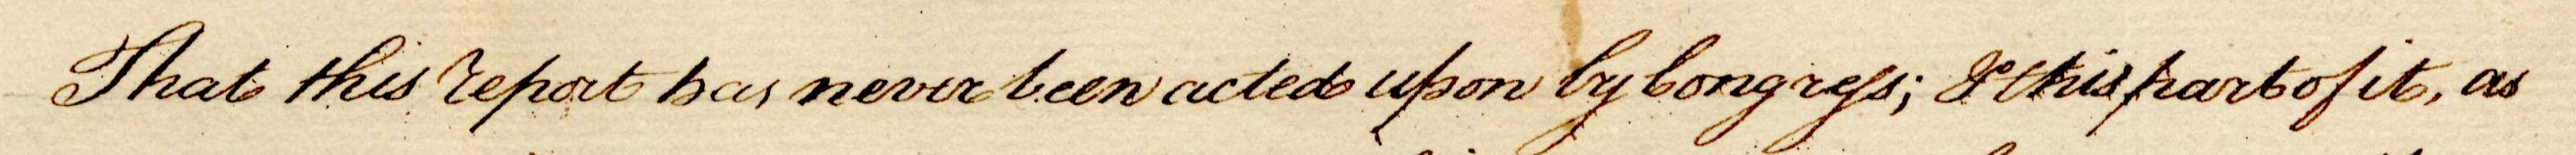That this report has never been acted upon by Congress; & this part of it, as
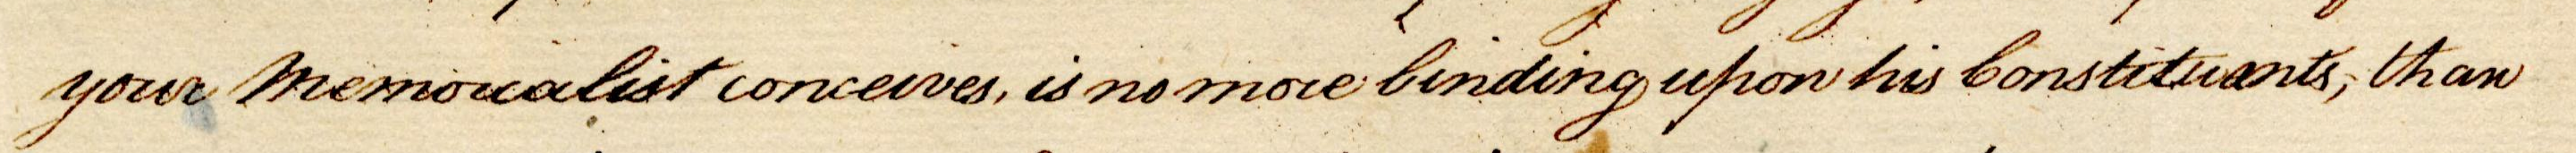your memorialist conceives, is no more binding upon his Constituents, than
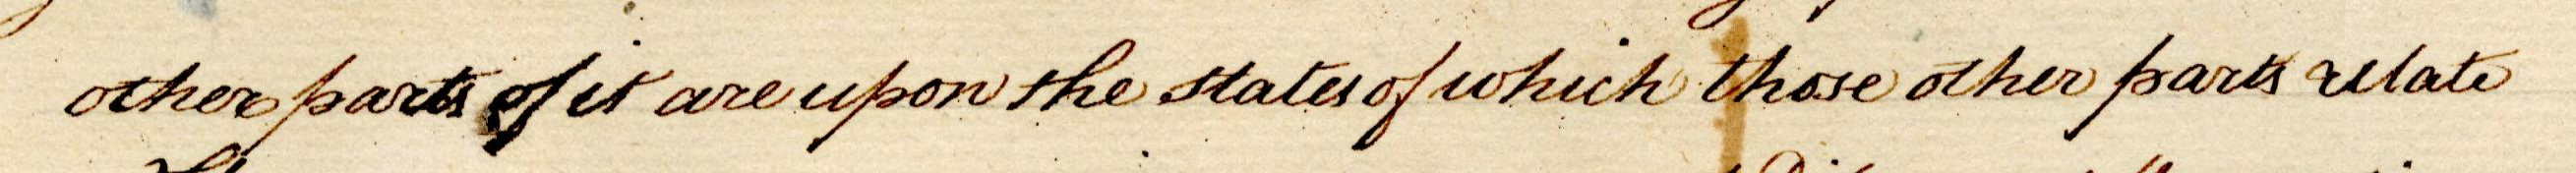other parts of it are upon the states of which those other parts relate
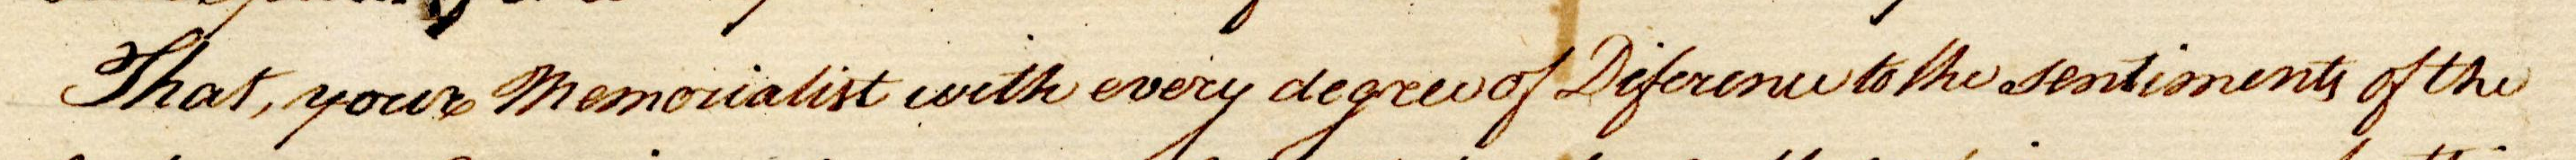That, your memorialist with every degree of Difference to the sentiments of the
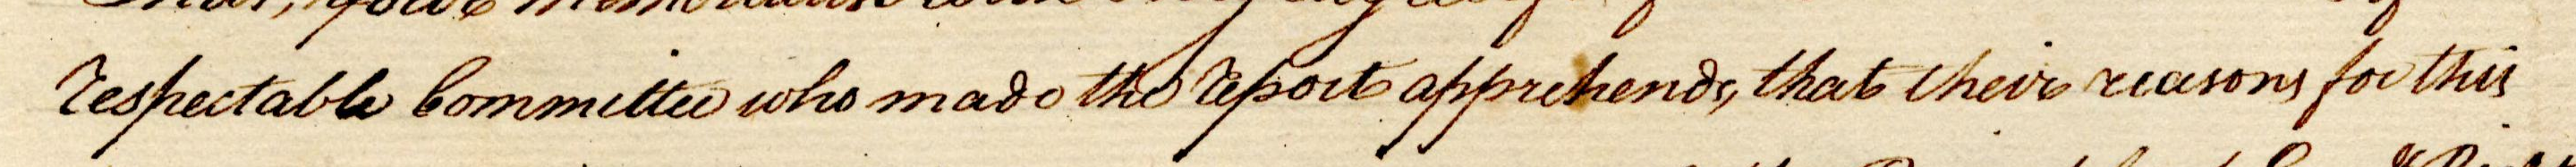respectable Committee who made the report apprehends, that their reasons for this
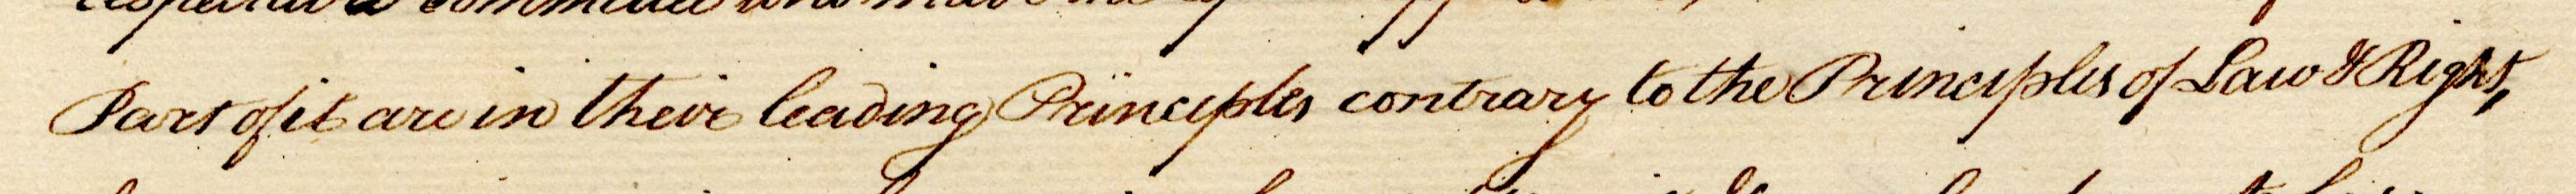Part of it are in their leading Principles contrary to the Principles of Law & Rights,
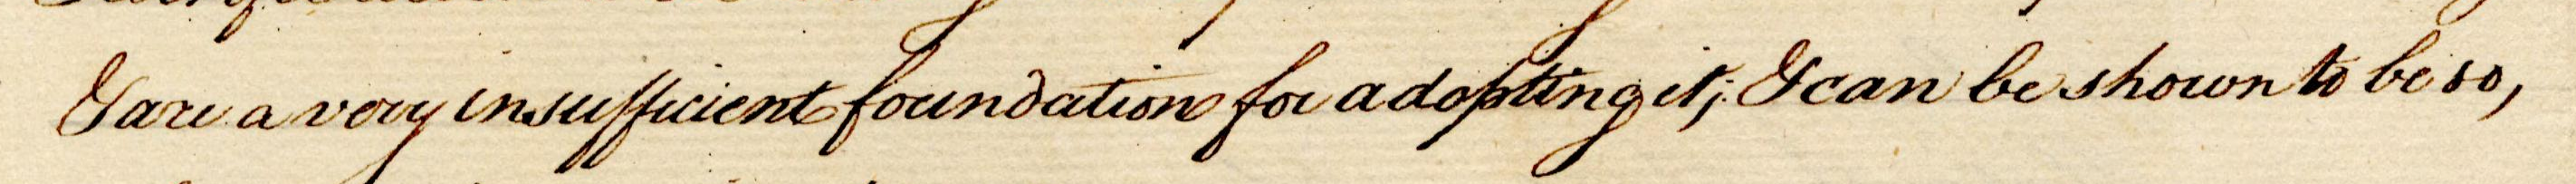& are a very insufficient foundation for adopting it; I can be shown to be so,
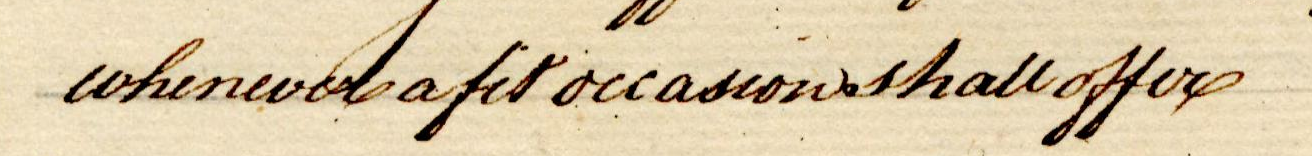whenever a fit occasion shall offer
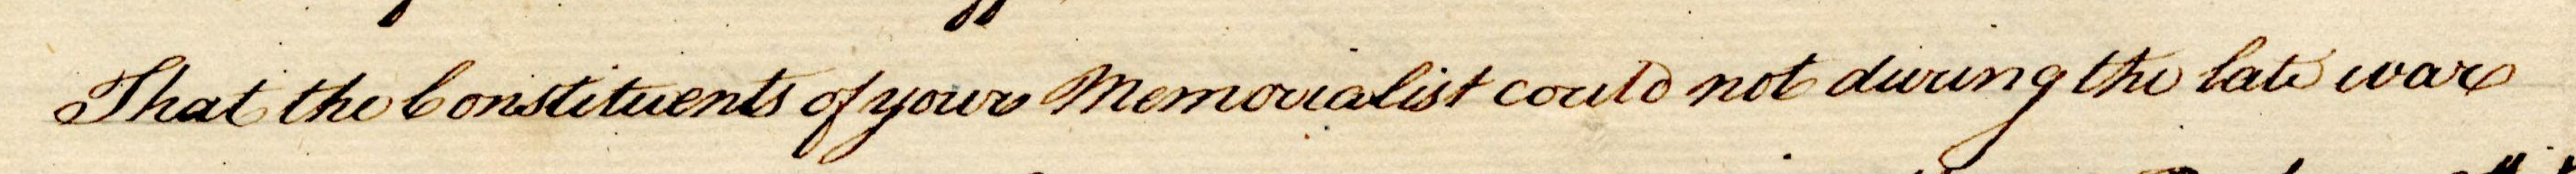That the Constituents of your Memorialist could not during the late war
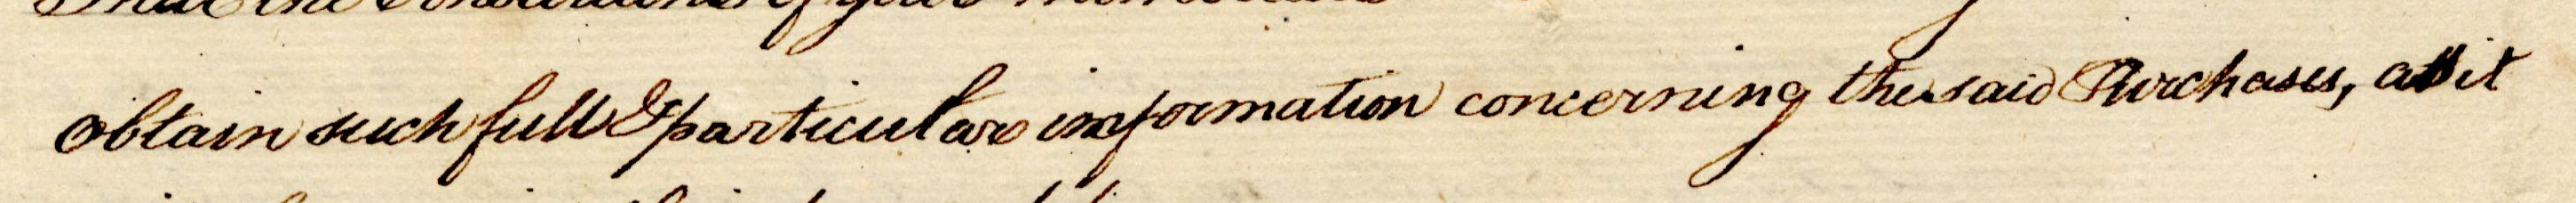obtain such full & particular information concerning the said Purchases, all it
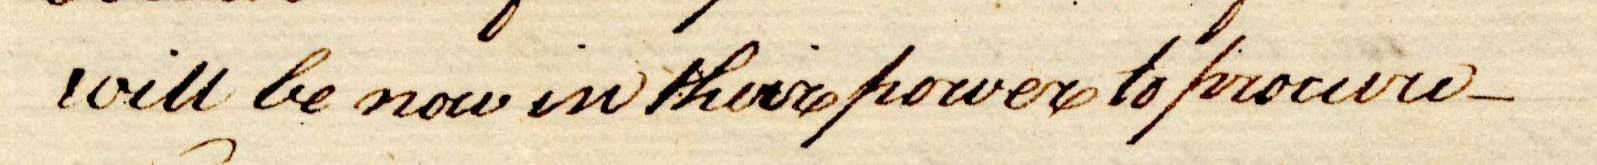will be now in their power to procure.-
